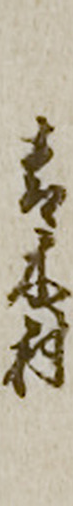青木村
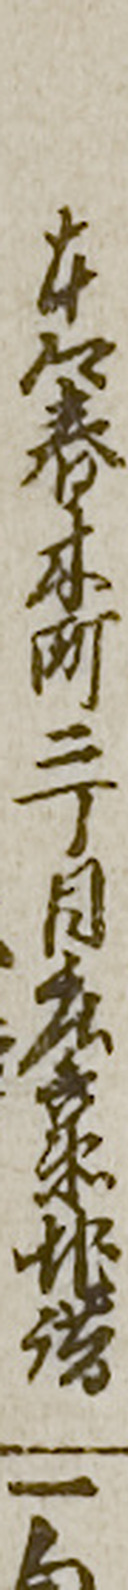本郷春木町二丁目庄兵衛地借
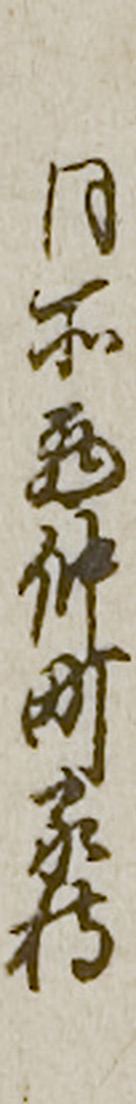同所西仲町家持
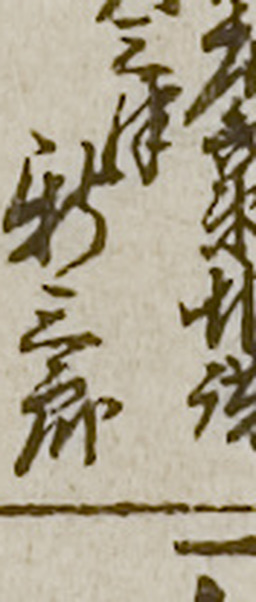喜三郎
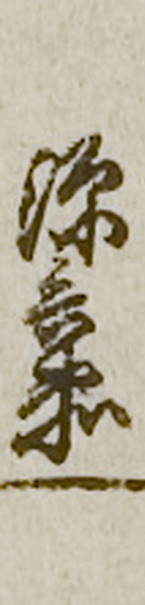平兵衛
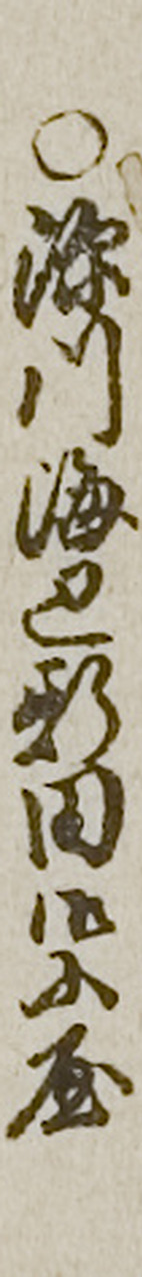○深川海辺新田御小屋
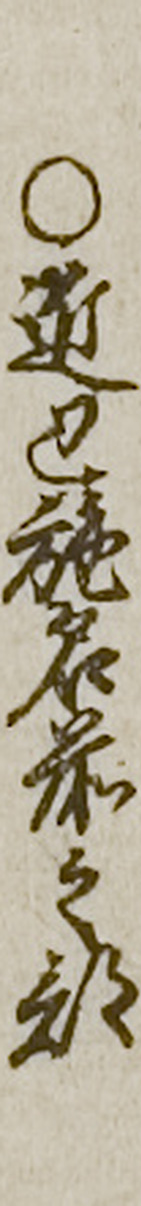○近辺施名前之部
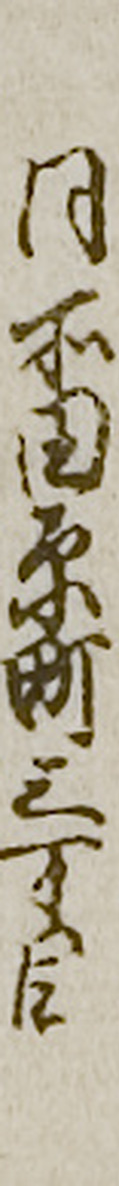同所田原町三丁目
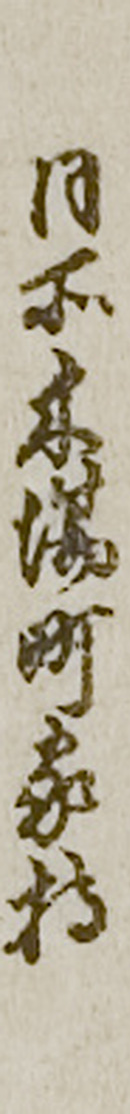同所木場町家持
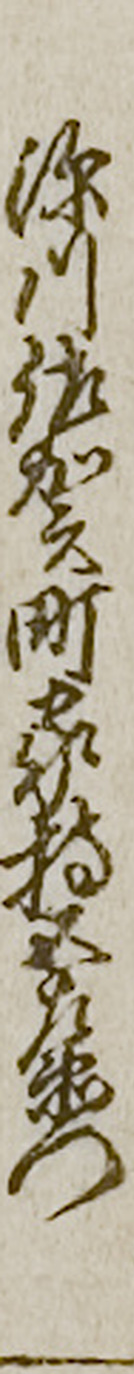深川佐賀町家持五左衛門
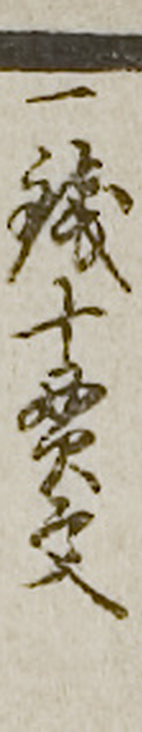一銭百貫文
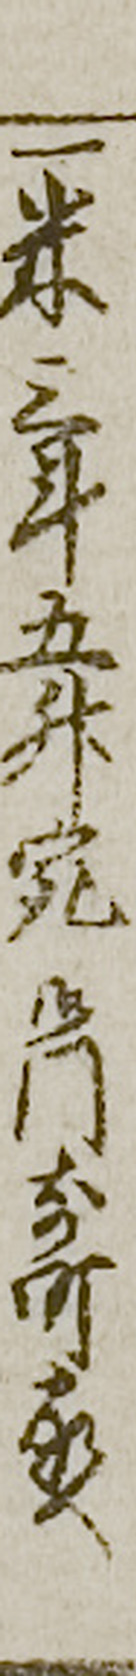一米三斗五升宛御門前町家へ
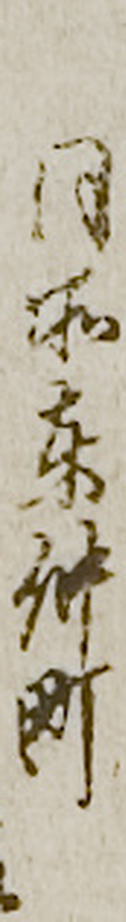同所東仲町
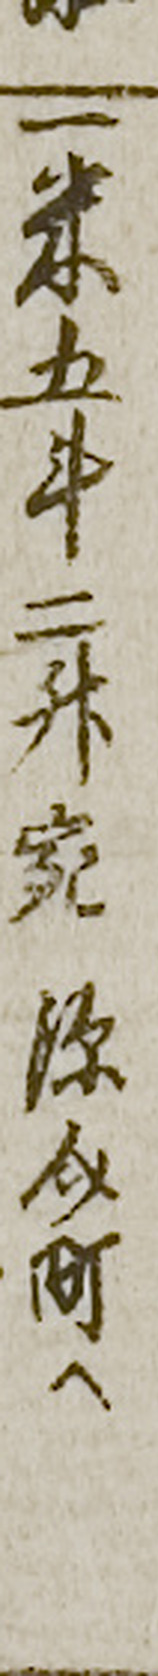一米五斗二升宛源介町へ
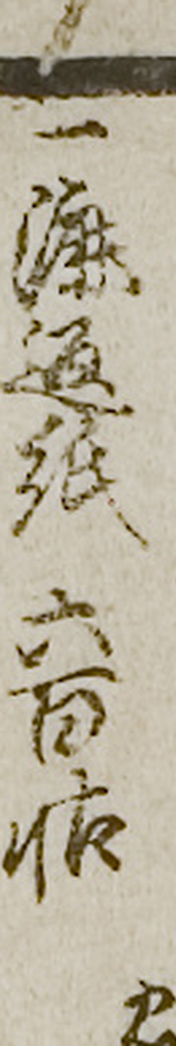一漉返紙六百帖中
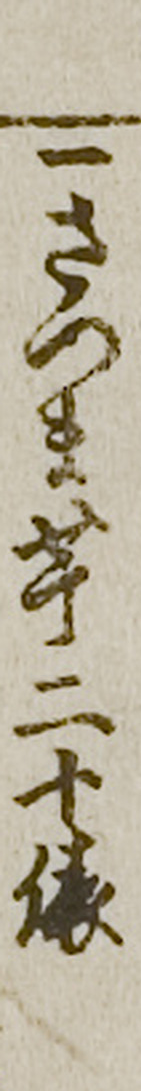一さつま芋十俵
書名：地震出火御救小屋施行名前附
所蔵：東京大学総合図書館 General Library in the University of Tokyo, JAPAN
